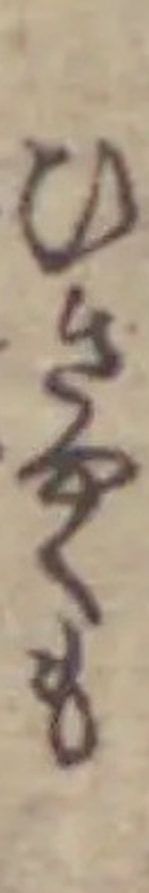ひきやくも
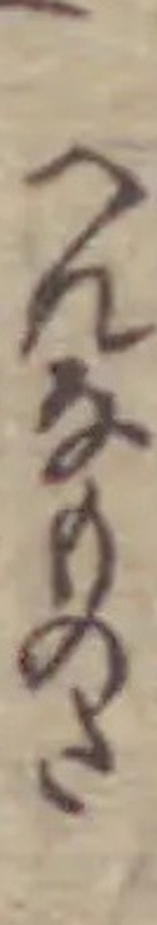へんなものた
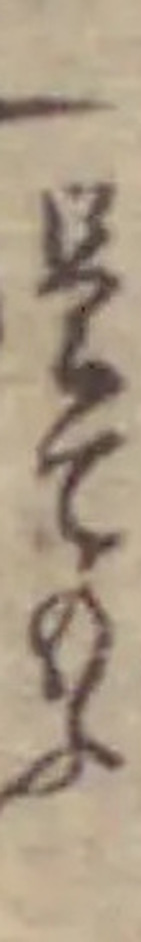是てもふ
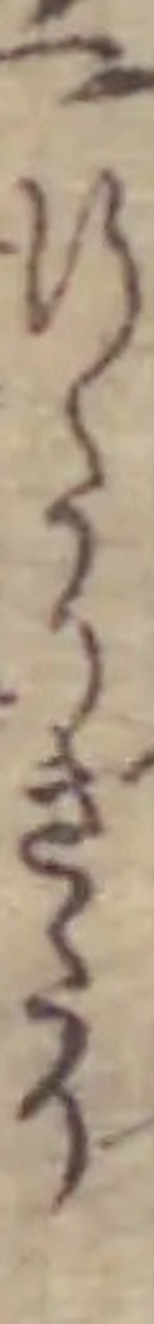行たりきたり
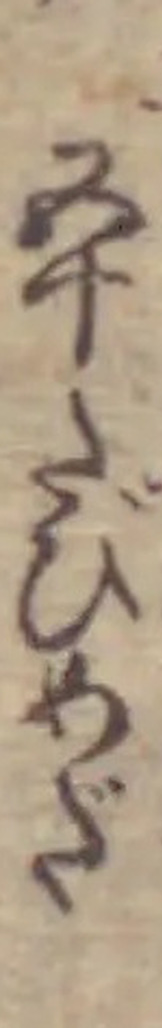五十たびめだ
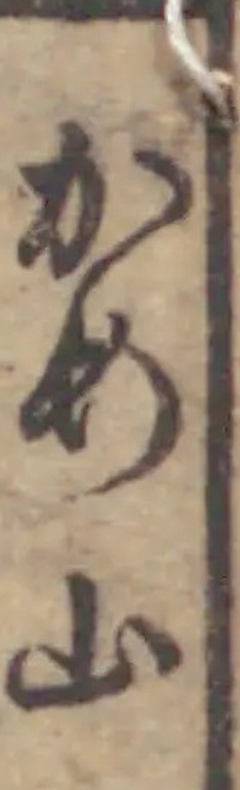かめ山
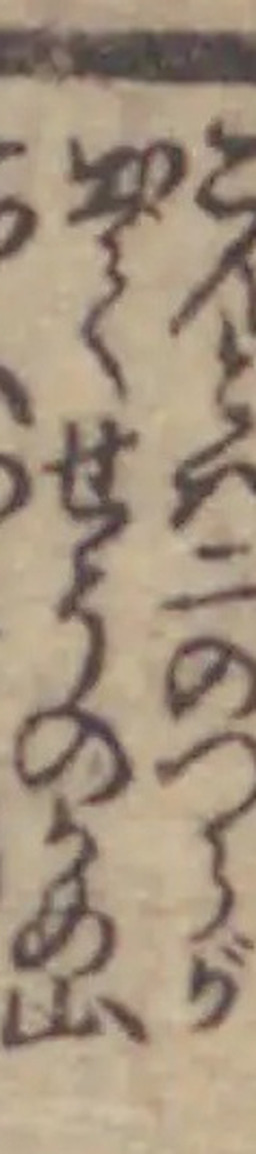出てせうのかめ山
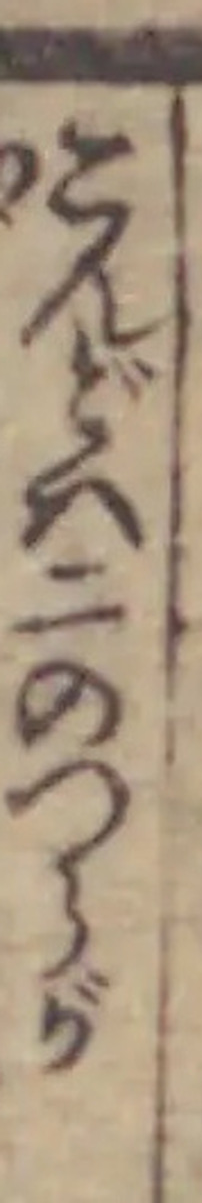こんどは二のつらが
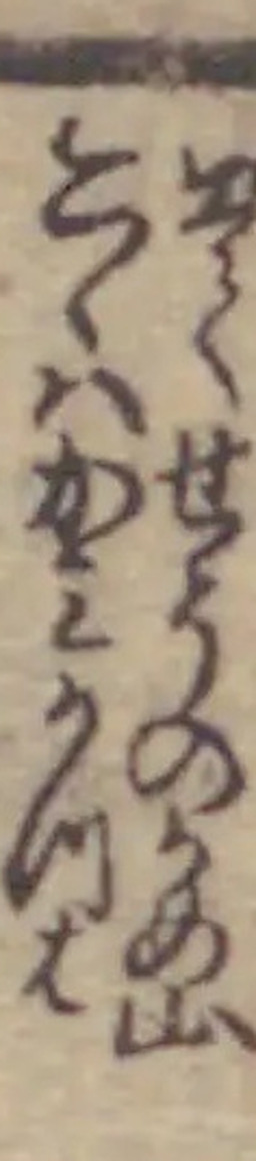こゝはかみかつは
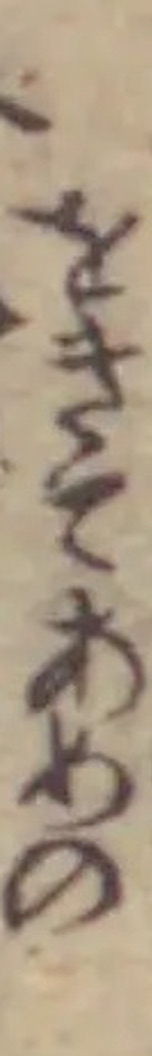をきてあめの
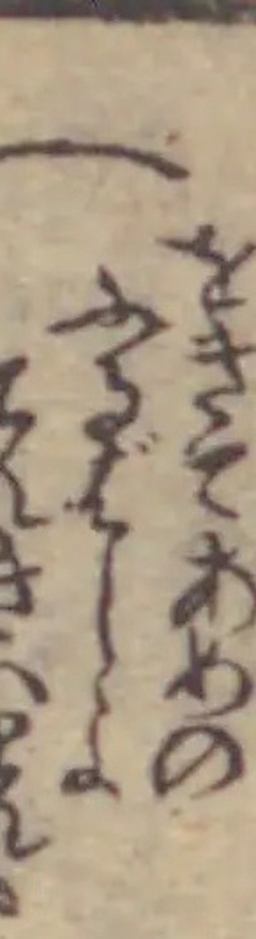ふるばしよ
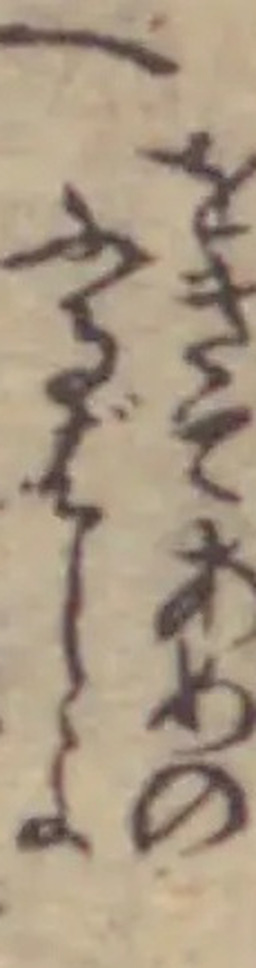ふるばしよ
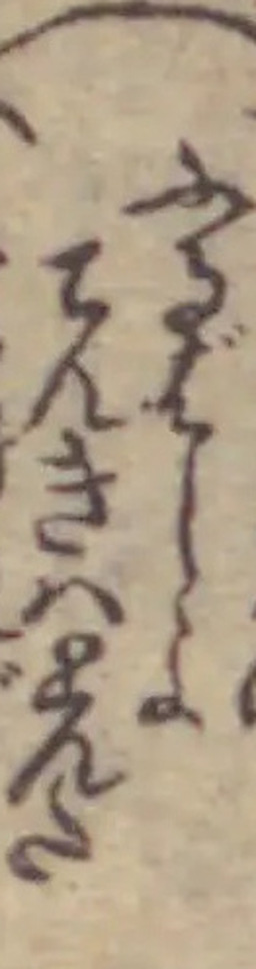てんきはとんた
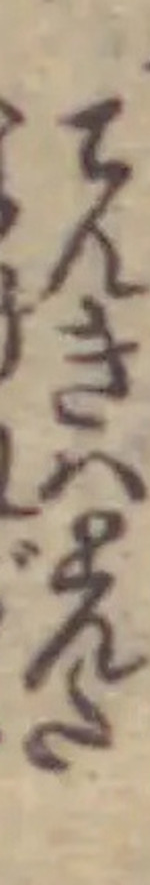てんきはとんた
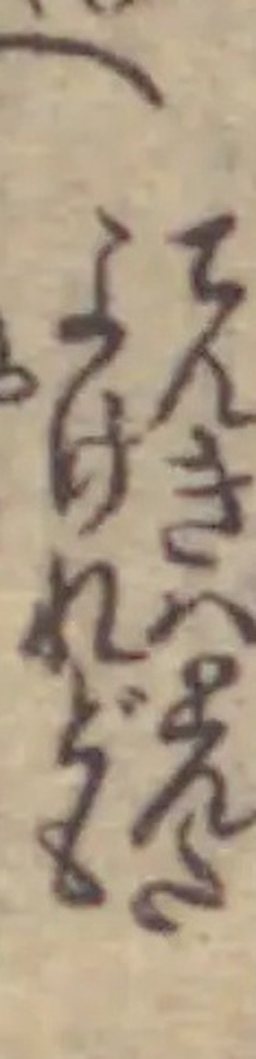よけれども
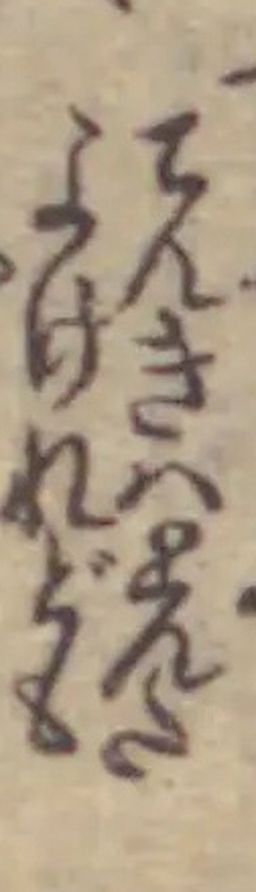よけれども
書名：道笑双六
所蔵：国立国会図書館 National Diet Library, JAPAN
